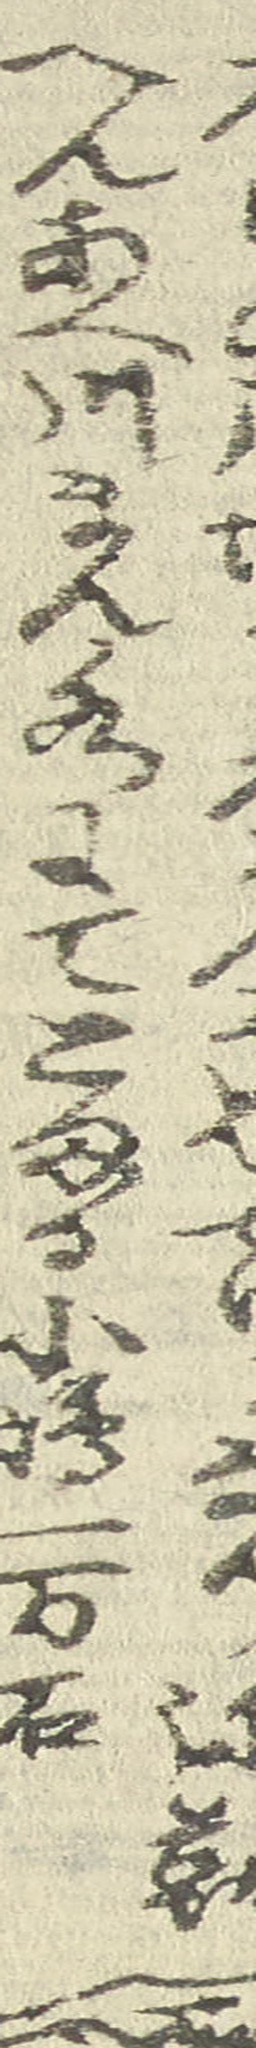へんあへ川まん水にてこまる小嶋一万石
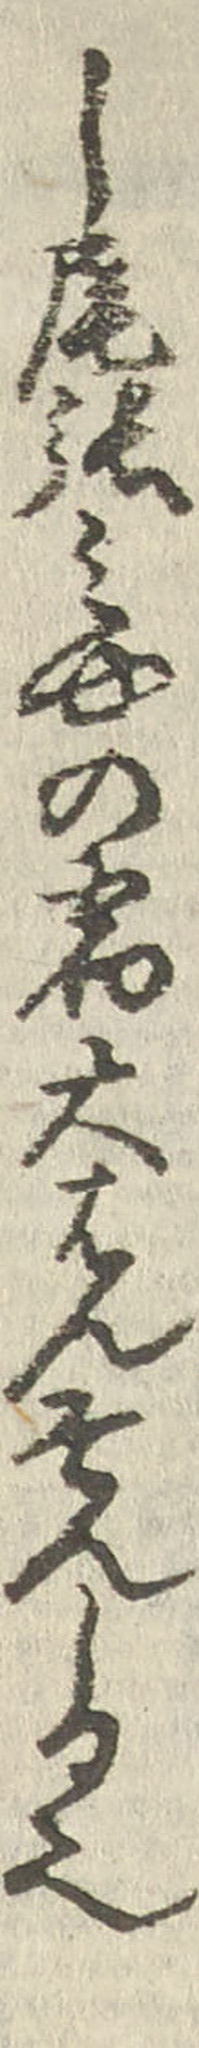し尾張みやの宿大はんそんしる也
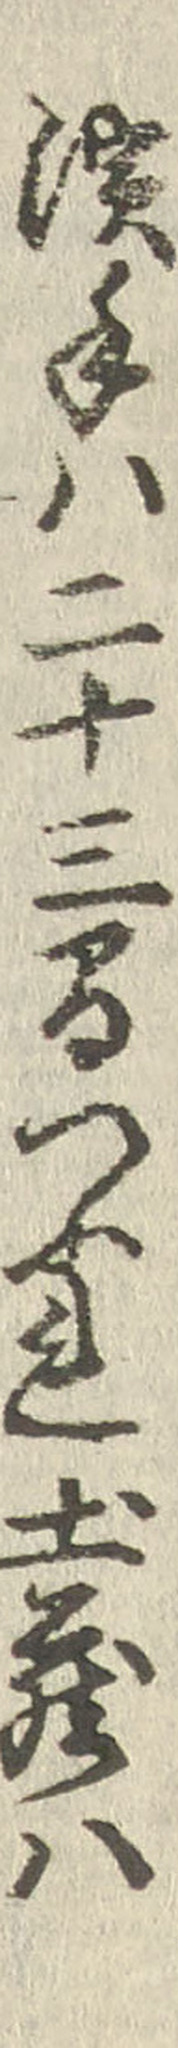浜手は二十三間つふれ土蔵は
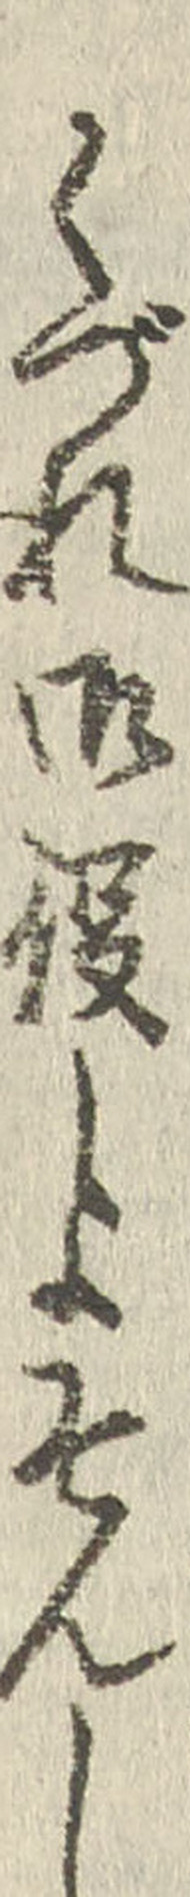くづれ御役しよそんし
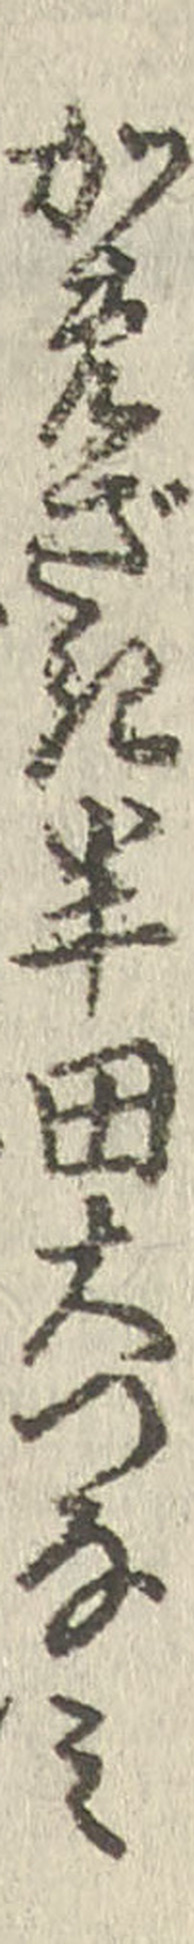かめざき半田大つなみ
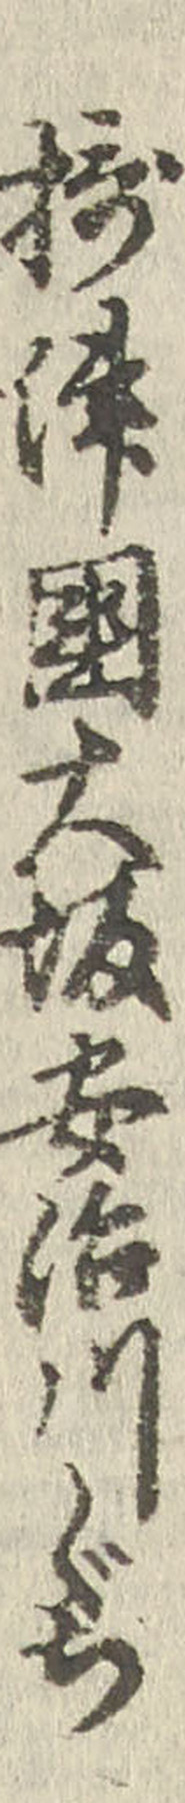摂津国大坂安倍川ぐち
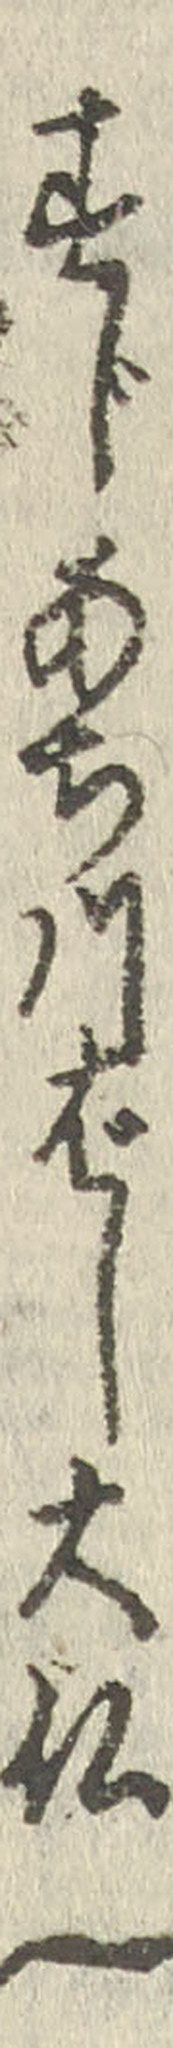すじあち川ばし大仏
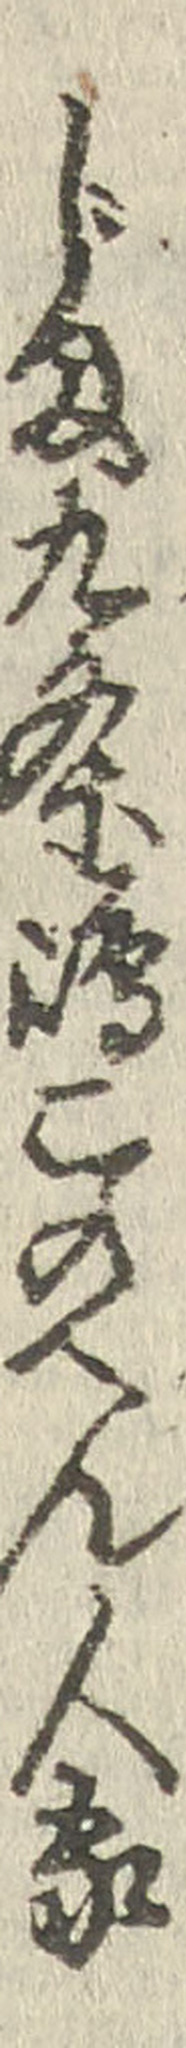じま九条嶋このへん人家
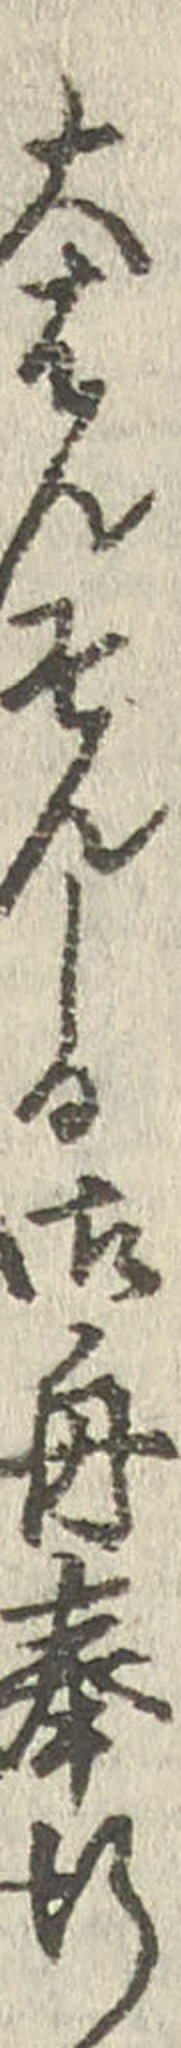大はんそんしる御舟奉行
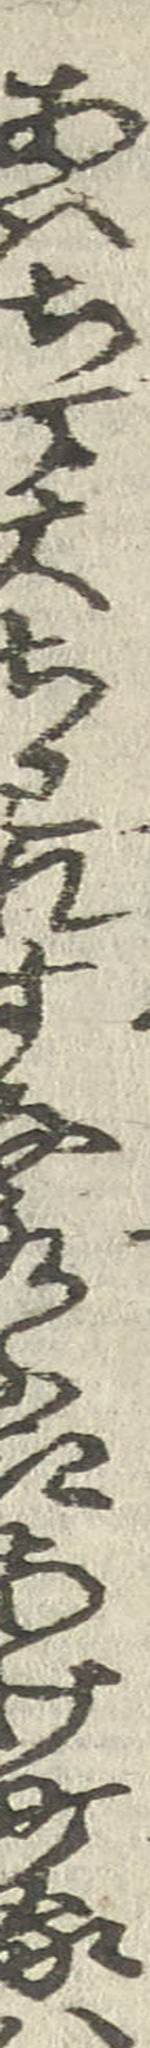あわち丁大ちわれすな水ふきあけ町家は
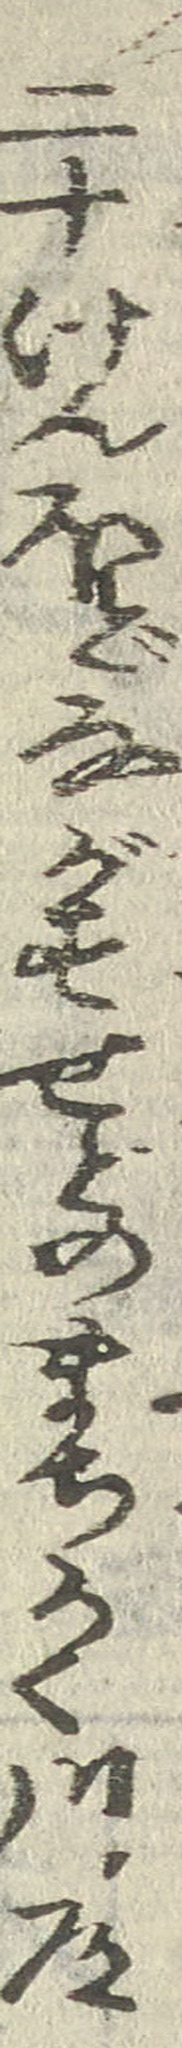二十けんほどながすせとのまちかく川道
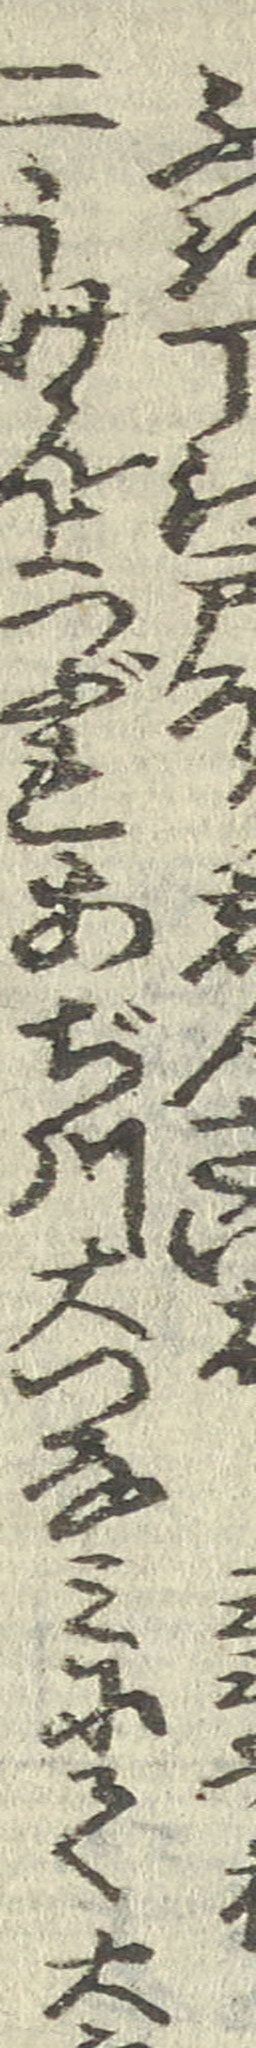二十けんよつぶれあぢ川大つなみにて大舟
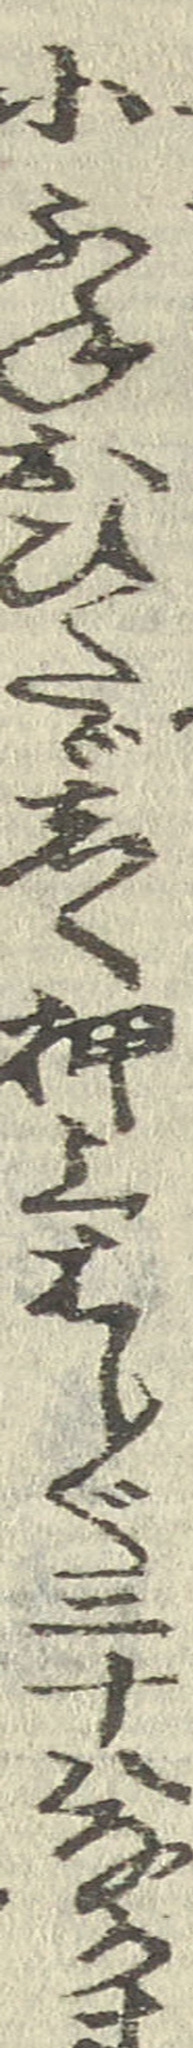小ふねおひたゞしく押上はし〴〵三十八なかす
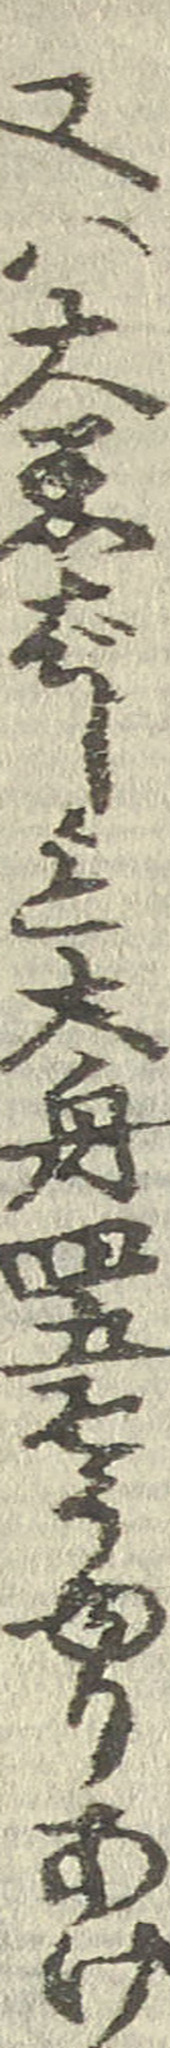又は大黒ばし迄大舟四五そうゆりあげ
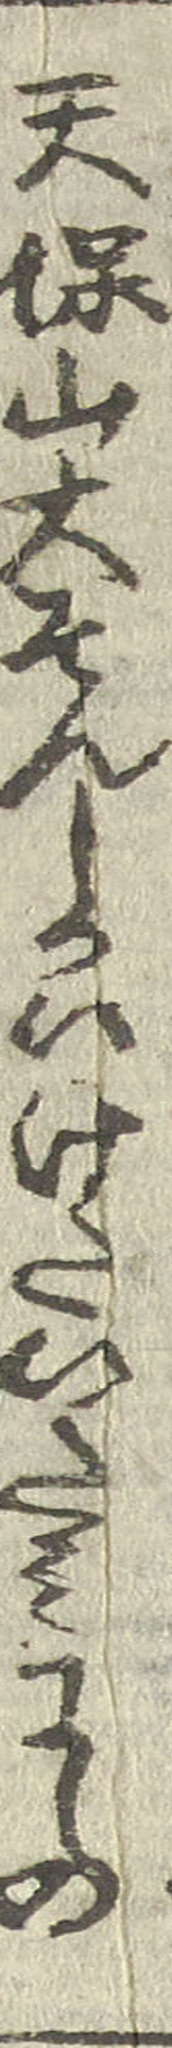天保山大そんしるいけたいたみよしの
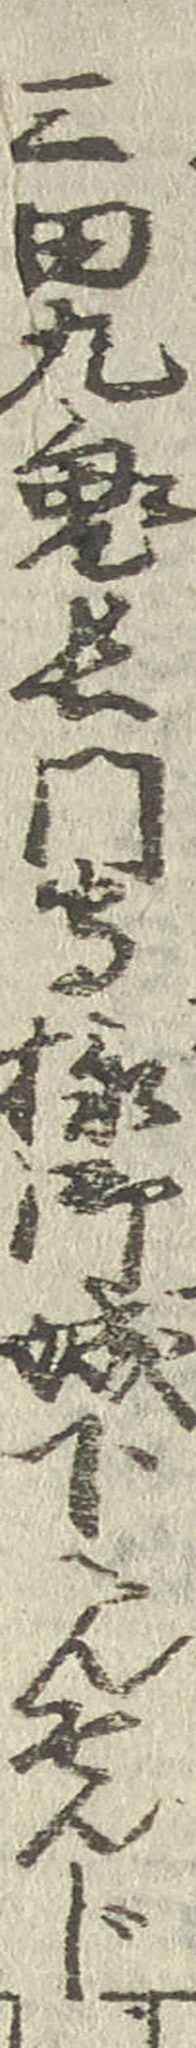三田九鬼長門守様御城下へんそんじ
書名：諸国大地震
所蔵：東京大学総合図書館 General Library in the University of Tokyo, JAPAN
